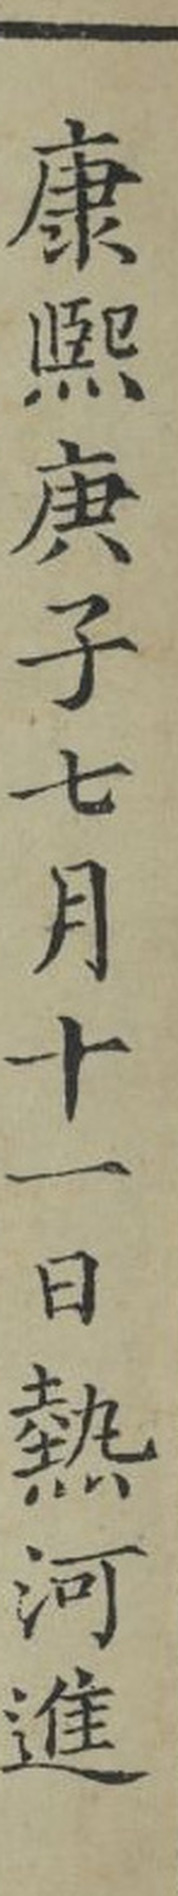康熈庚子七月十一日熱河進
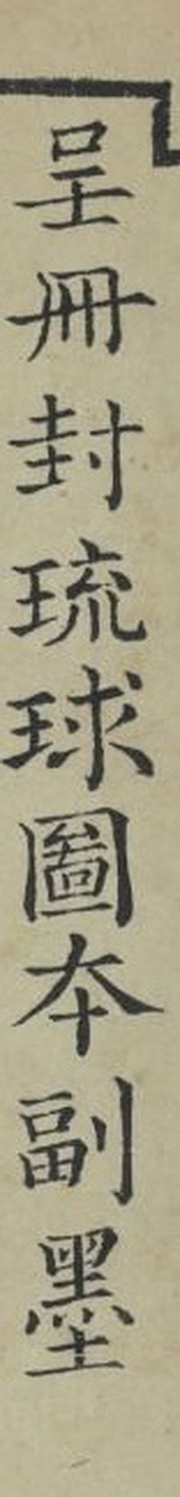呈冊封琉球圗夲副墨
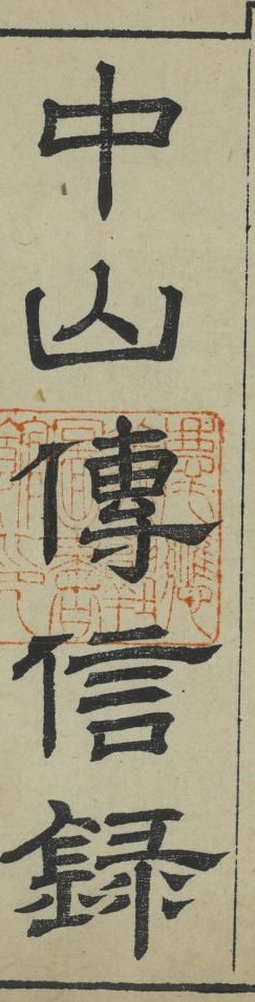中山傳信録
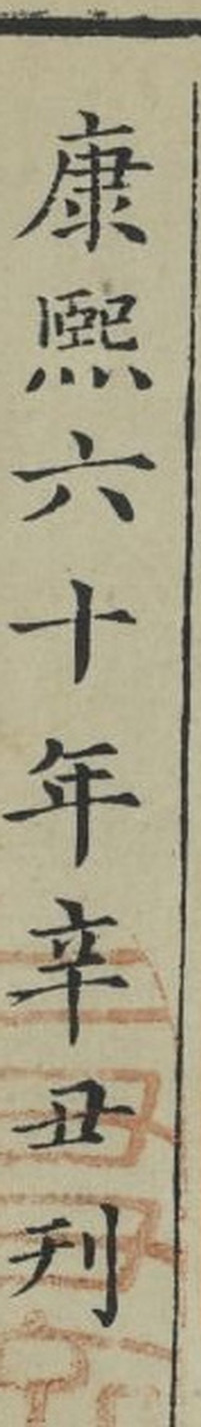康熙六十年辛丑刊
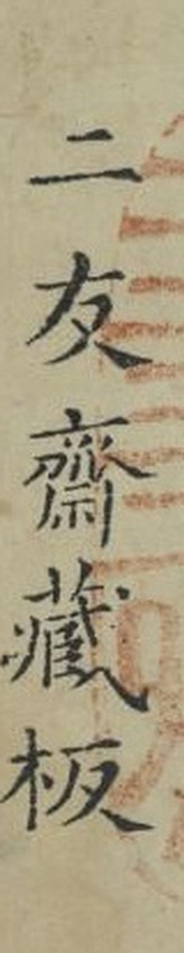二友齋藏板

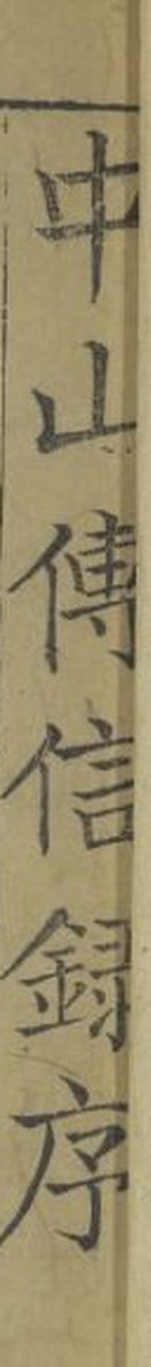中山傳信録序
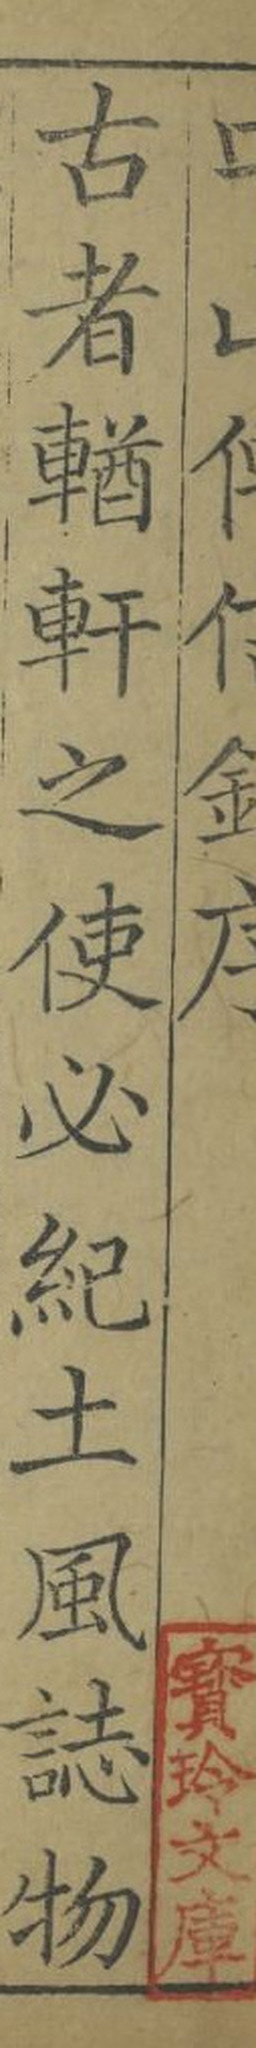古者輶軒之使必紀土風誌物
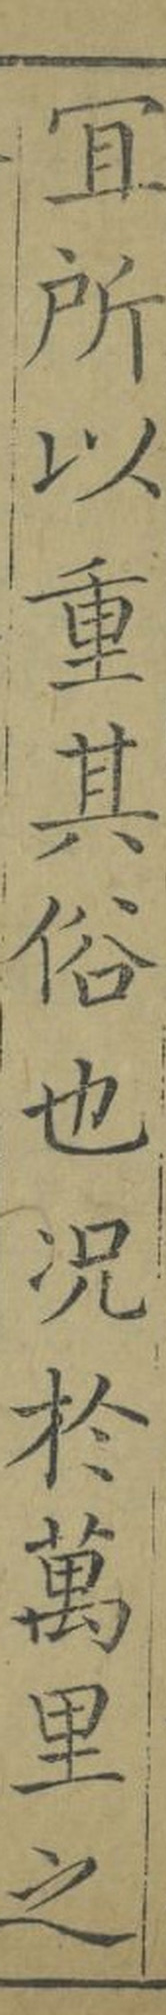冝所以重其俗也况扵萬里之
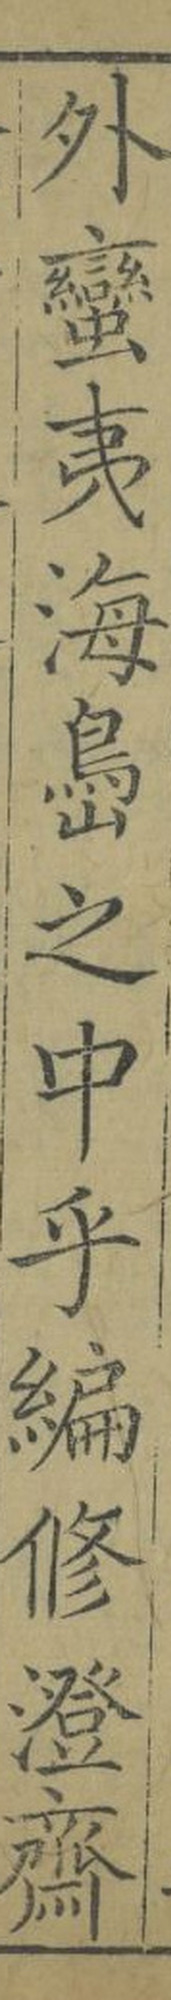外蠻夷海㠀之中乎編修澄齋
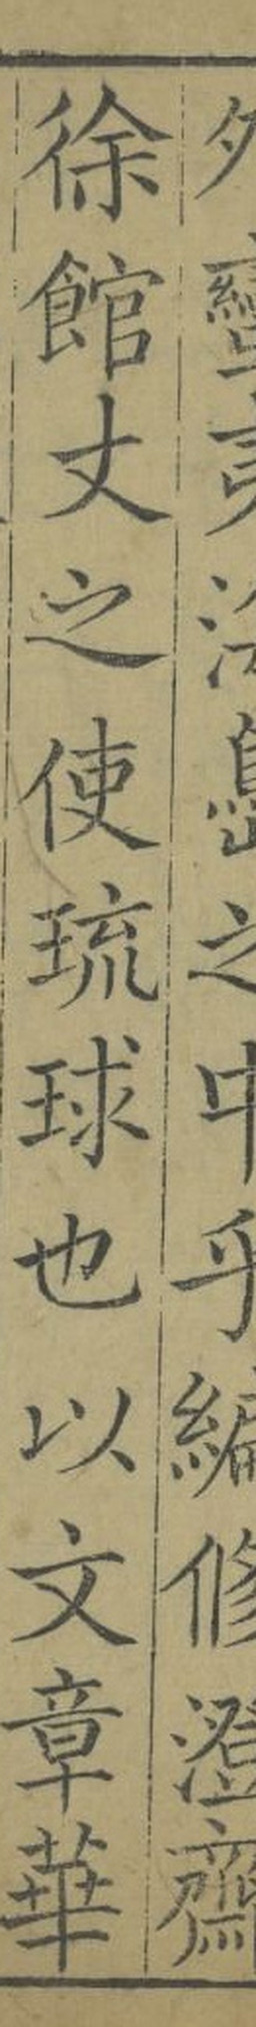徐館丈之使琉球也以文章華
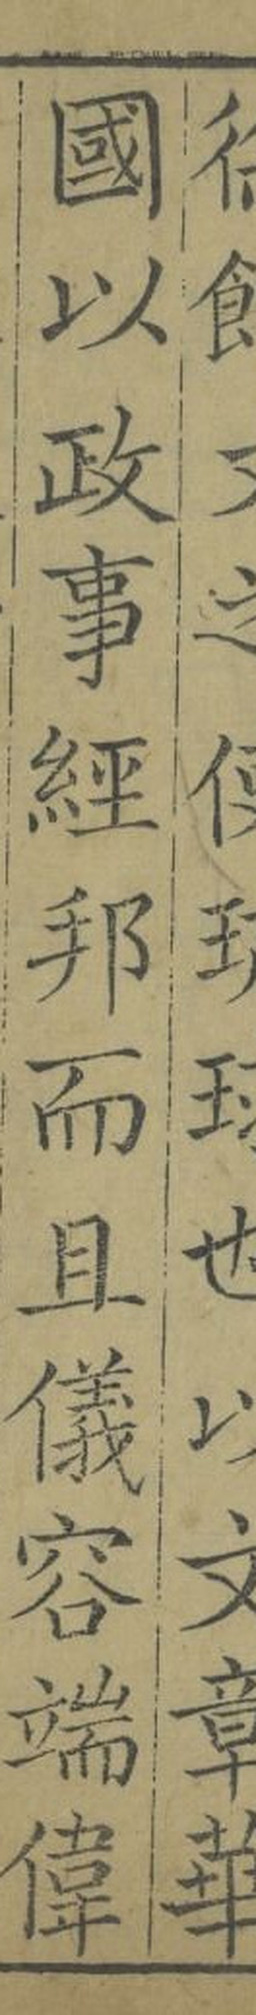國以政事經邦而且儀容端偉
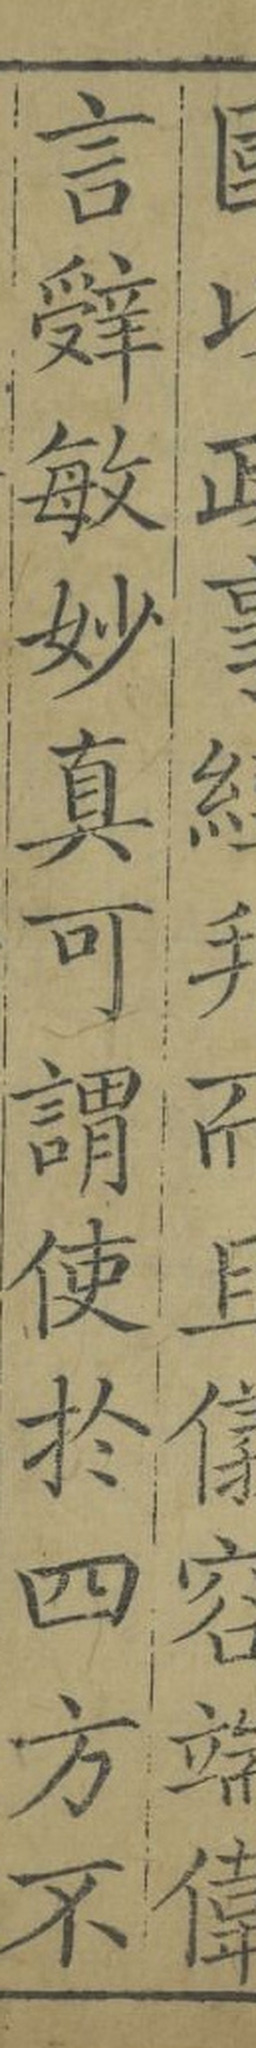言辤敏妙真可謂使扵四方不
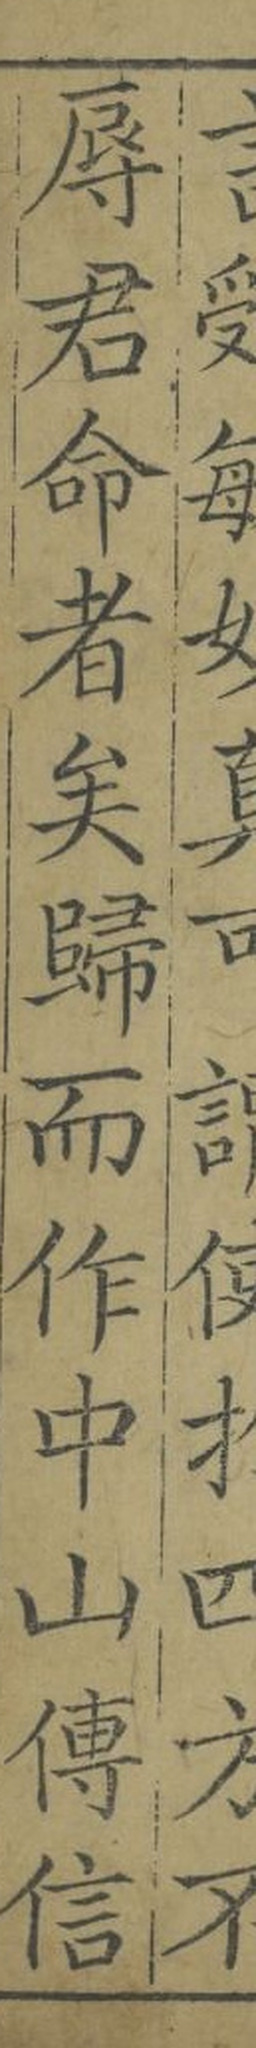辱君命者矣歸而作中山傳信

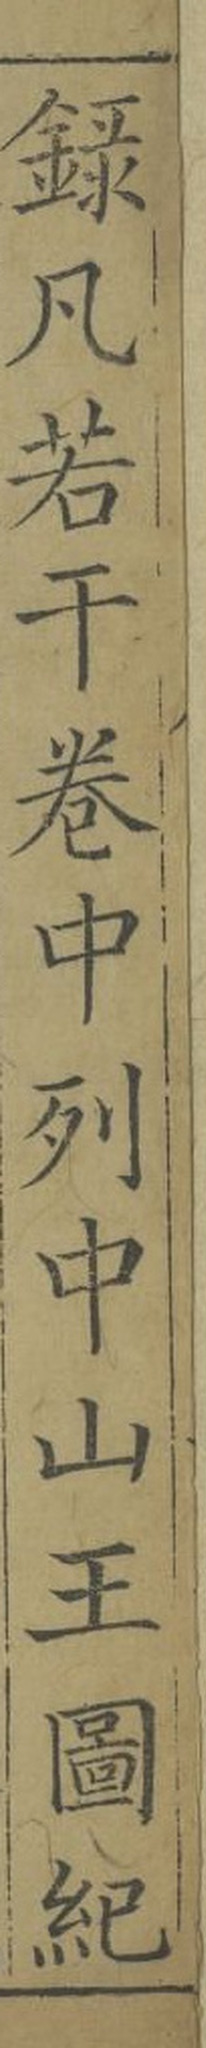録凡若干巻中列中山王圖紀
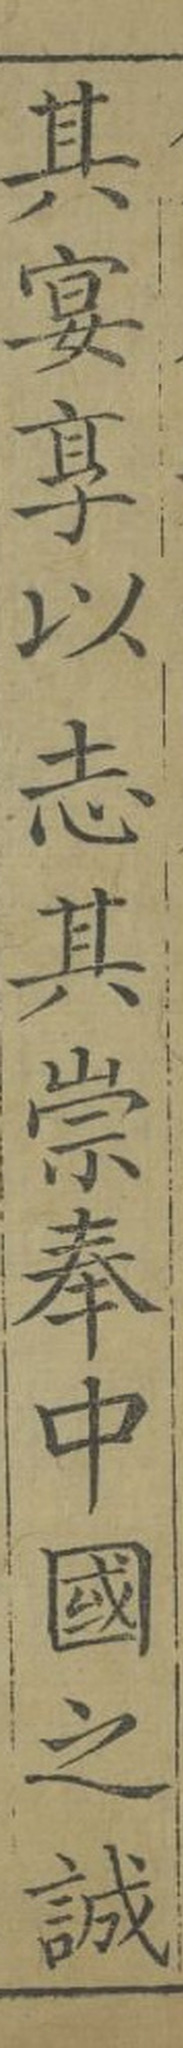其宴享以志其崇奉中國之誠
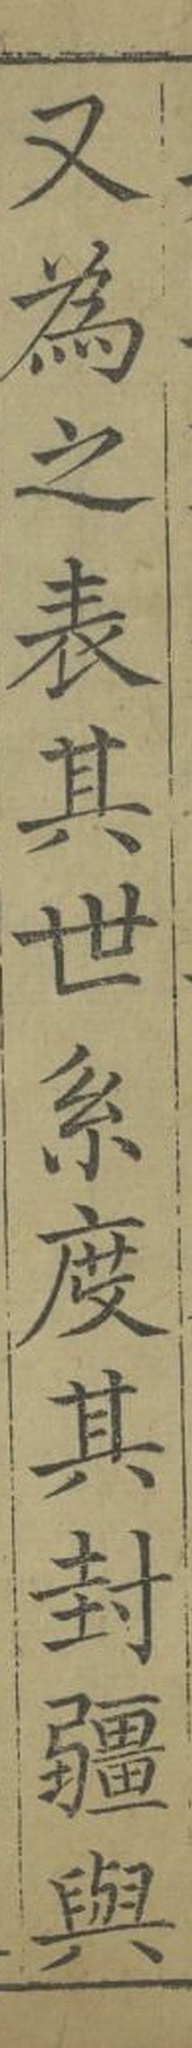又為之表其世系度其封疆與
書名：中山伝信録 巻一
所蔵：University of the Ryukyus Library
